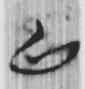㠯（以）
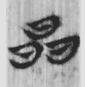晶
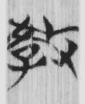教
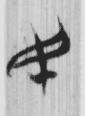民
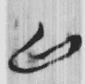㠯（以）
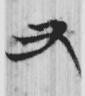又
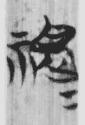{示畏}
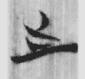之
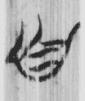頁
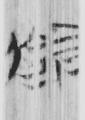備
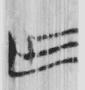乍
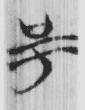{口于}
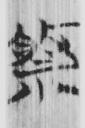祭
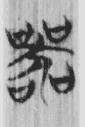器
